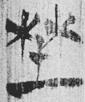埜
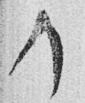人
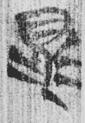鳥
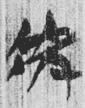虎
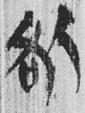咎
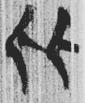比
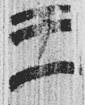王
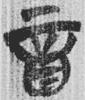音
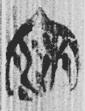深
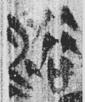浴（穀）
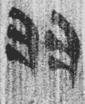羽
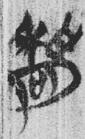嘉
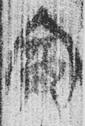賓
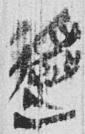{道臼}（道）
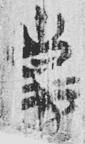憙（喜）
